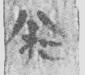八十=
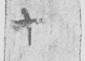七
